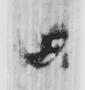曰
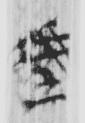𫊟
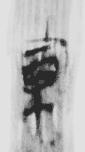倝
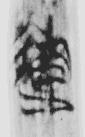{止達}
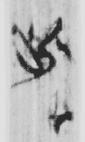此
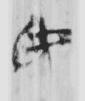母
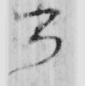乃
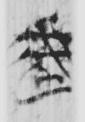𫊟
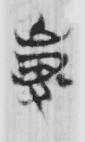尃
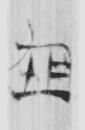均
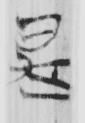是
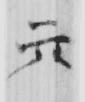亓
